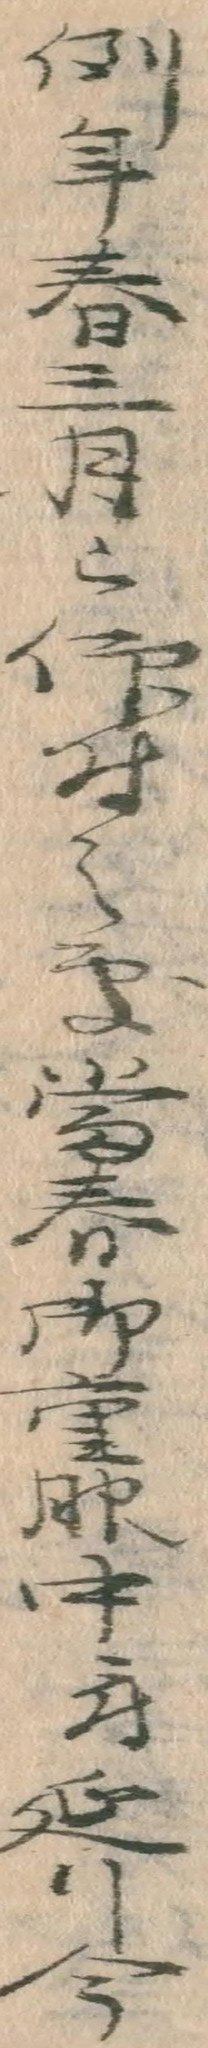例年春三月被仰付候處當春御重服中ニ付延引今
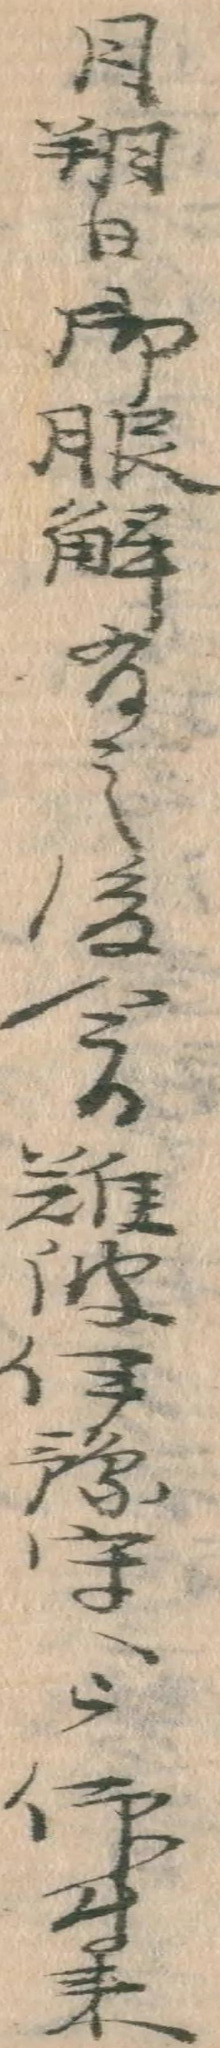月朔日御眼解有之後今日難波伊豫守へ被仰付来
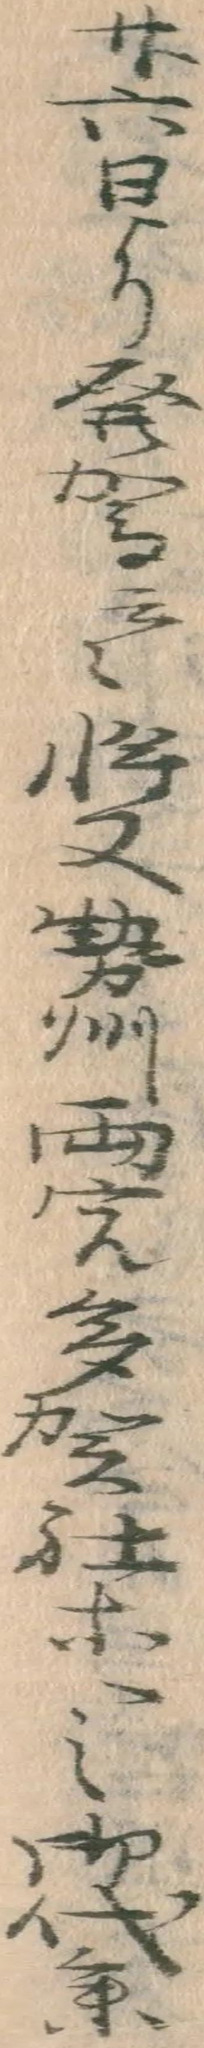廿六日より発駕云々将又勢州両宮多賀社等へ之御代参
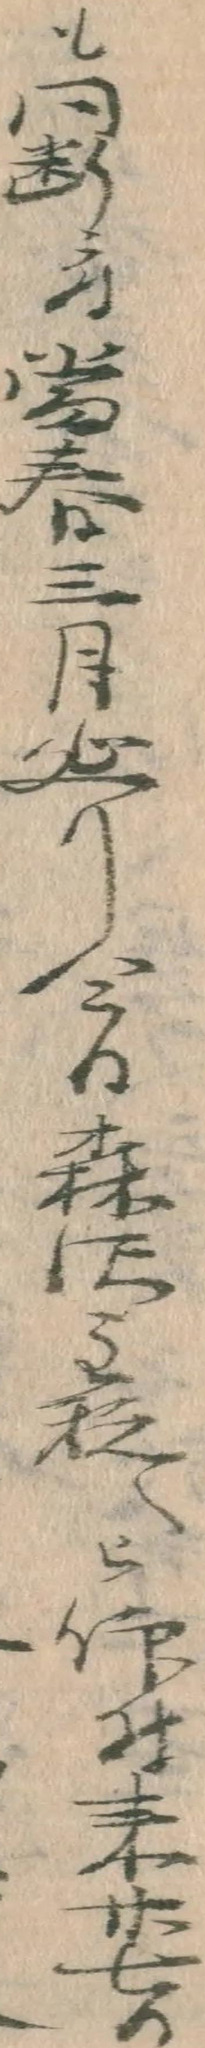も同断に付當春三月延引今日森沢主税へ被仰付来廿七日
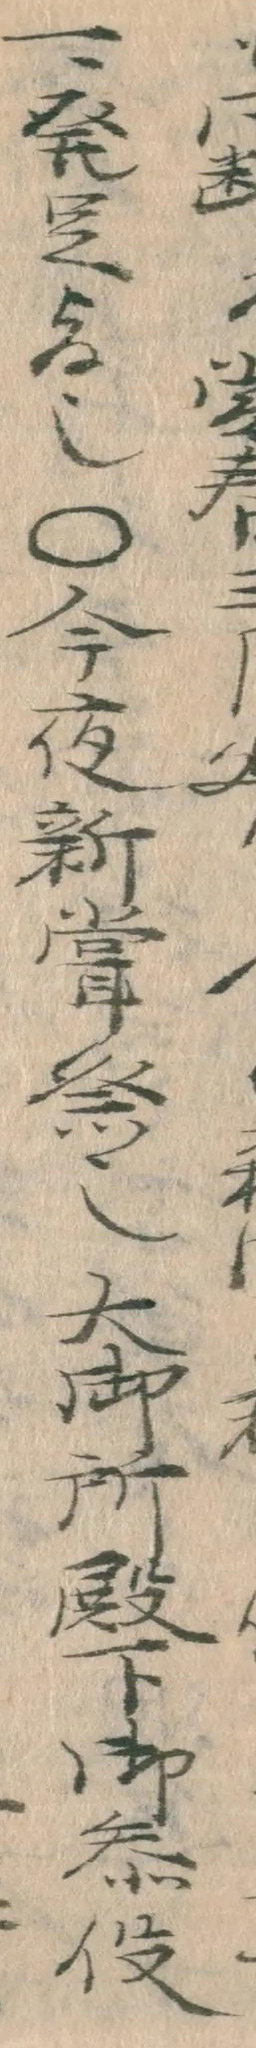可発足旨也○今夜新嘗祭也大御所殿下御参役
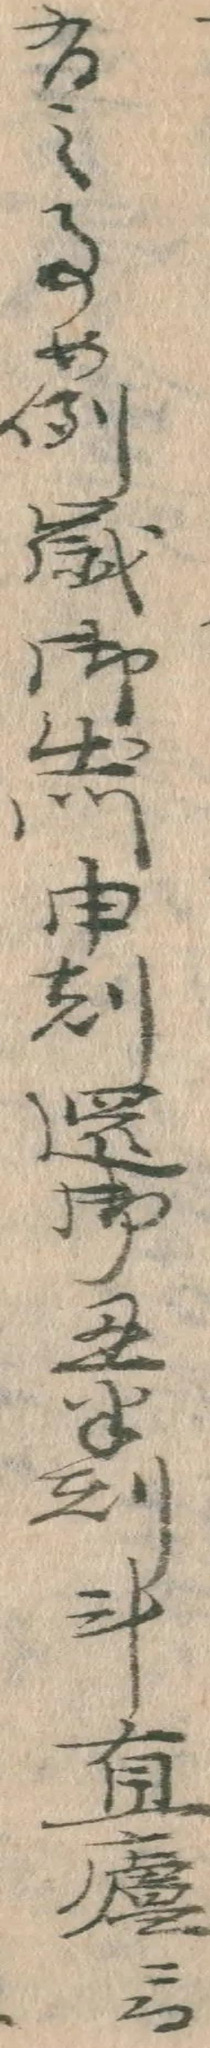有之事如例歳御出門申刻還御丑半刻斗直瘧ニ而
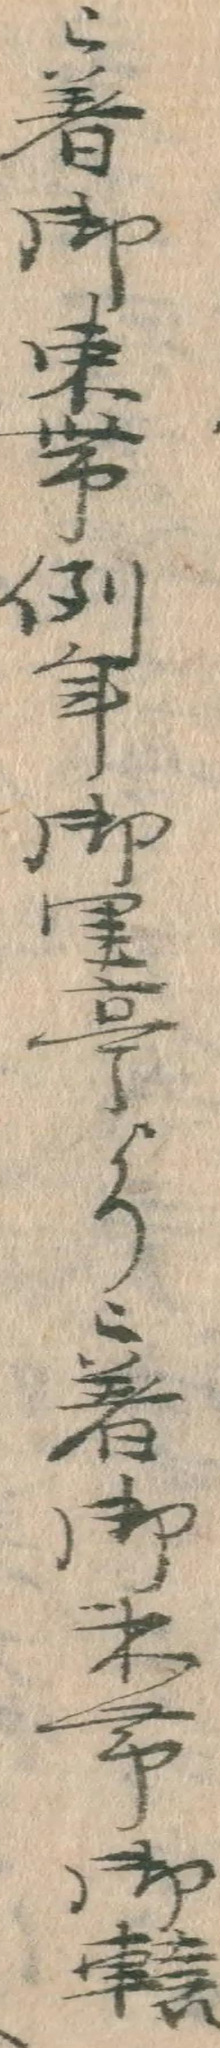被着御束帯例年御里亭より被着於御束帯御轅
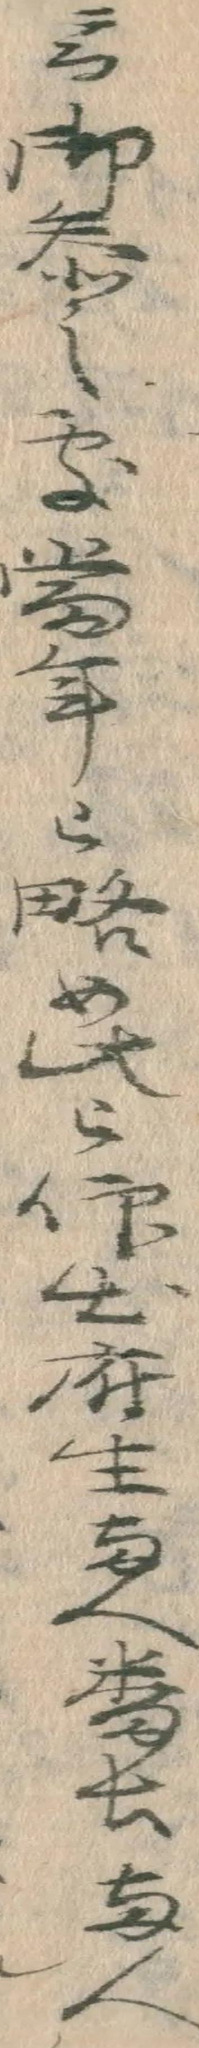ニ而御参之處當年被略如此被仰出府生両人番長両人
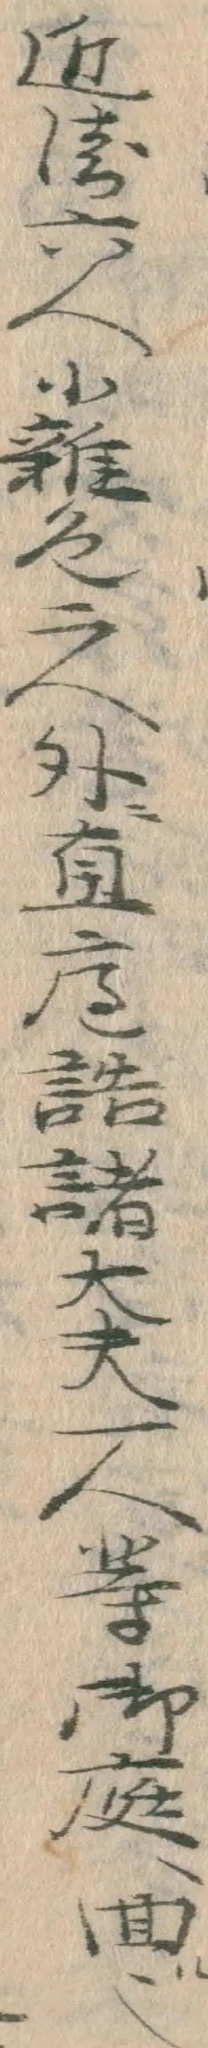近衛六人小雑色二人外ニ直庭詰諸大夫一人等御庭へ回ル也
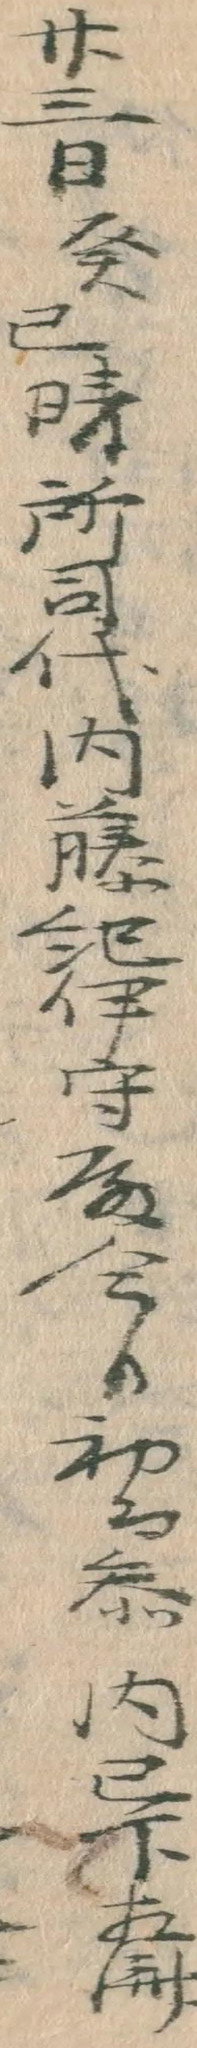廿三日癸巳晴所司代内藤紀伊守殿今日初而参内已下相済
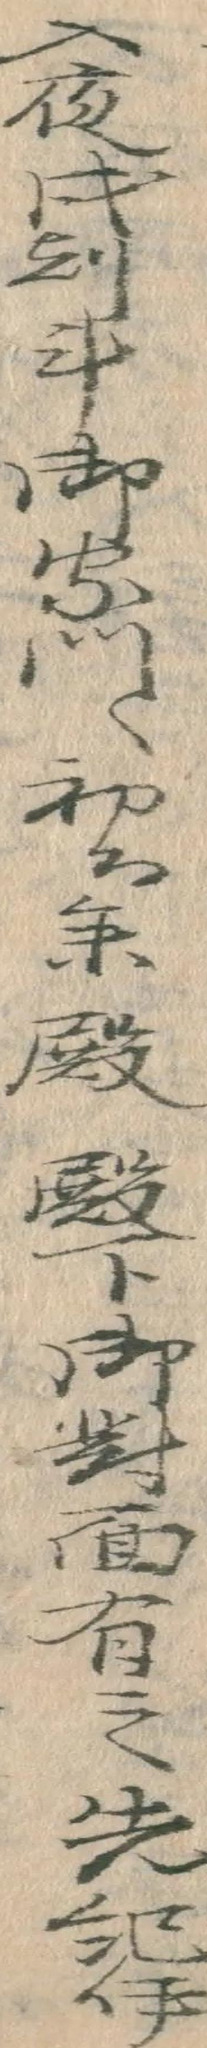入夜戌刻斗御家門へ初而東殿殿下御對面有之先紀伊
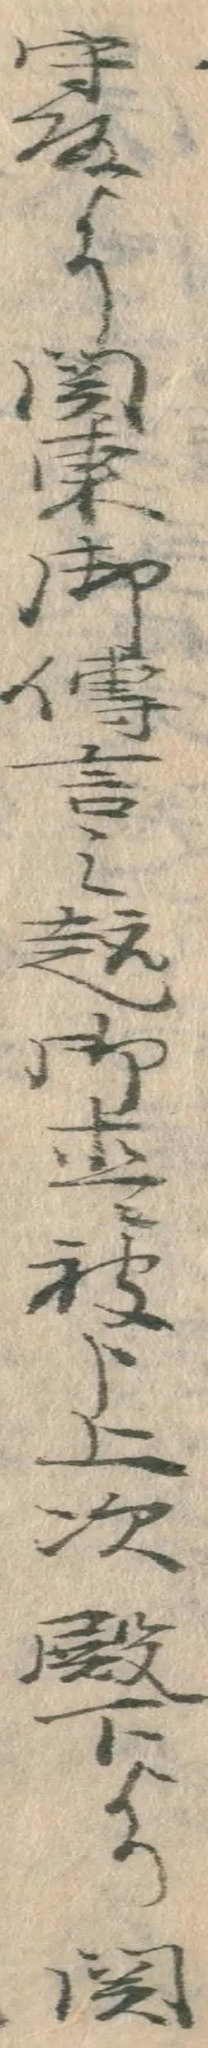守殿より関東御傳言之趣御直ニ被申上次殿下より関
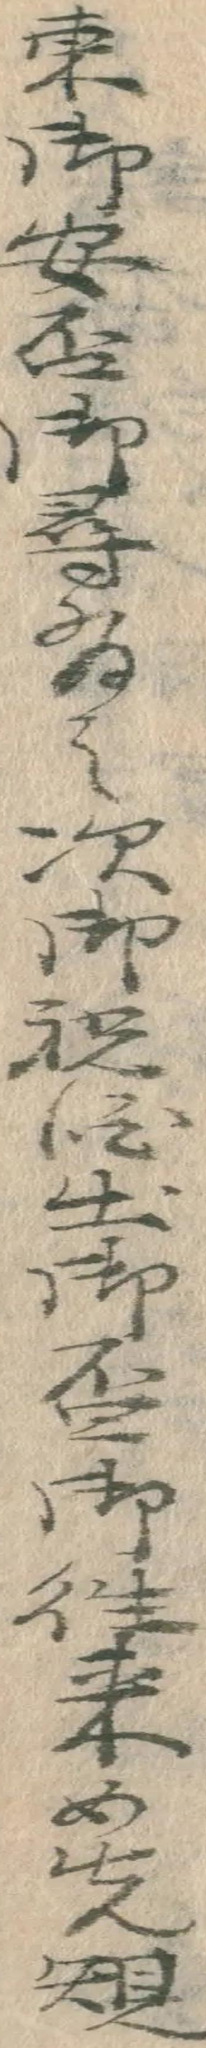東御安否御尋有之次御祝義出御盃御往来如先規
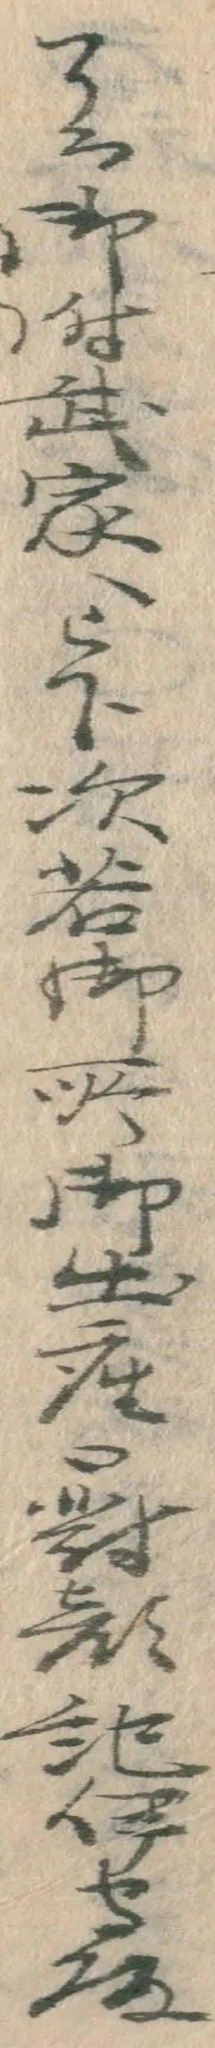了而御附武家へ被下次若御所御出座御對顔紀伊守殿
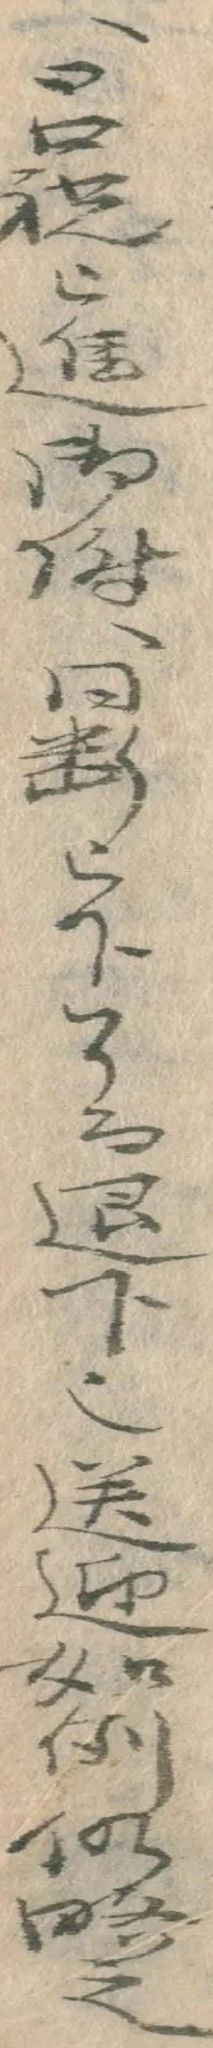へ御口祝被進御附へ同断被下候而退下也送迎如例仍略之

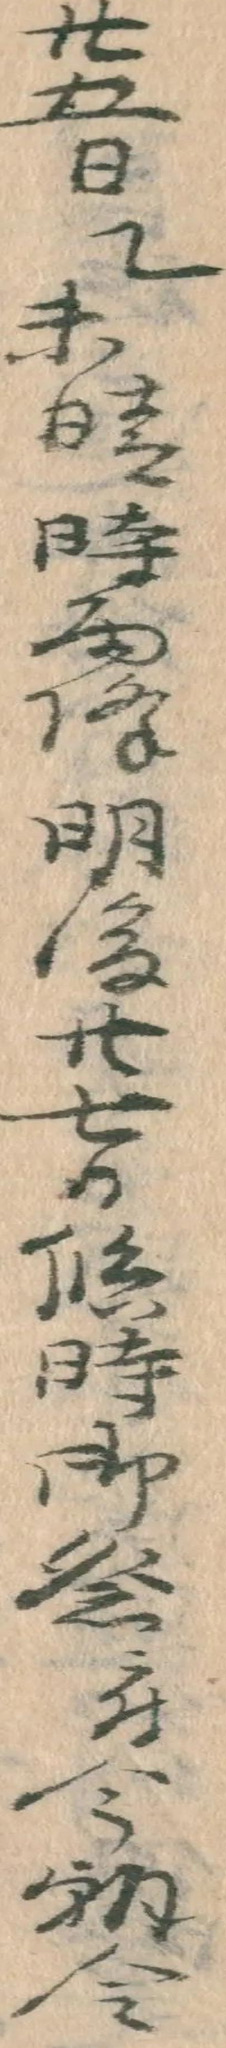廿五日乙未晴時雨降明後廿七日臨時御祭ニ付今朝令
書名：賀茂社記録. 第63冊
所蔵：国立国会図書館 National Diet Library, JAPAN
